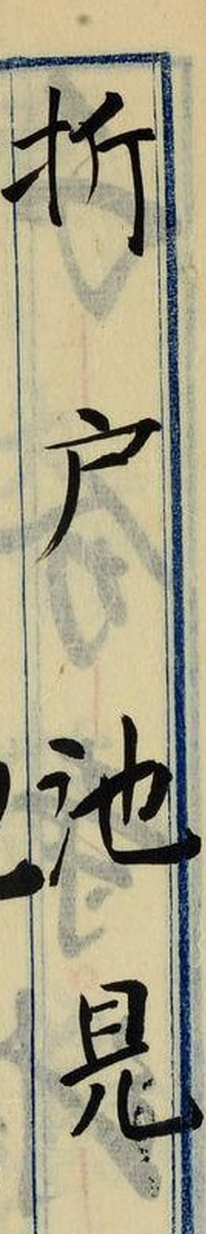折戸池見
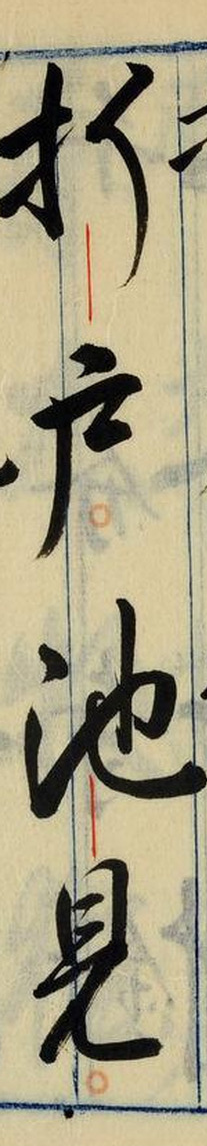折戸池見
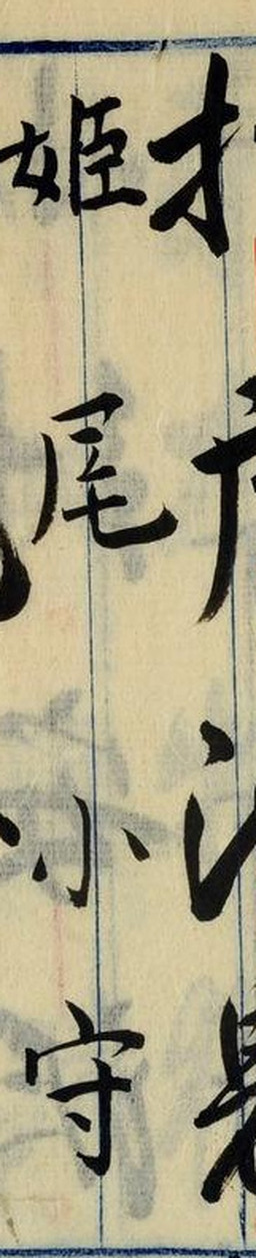姫尾小守
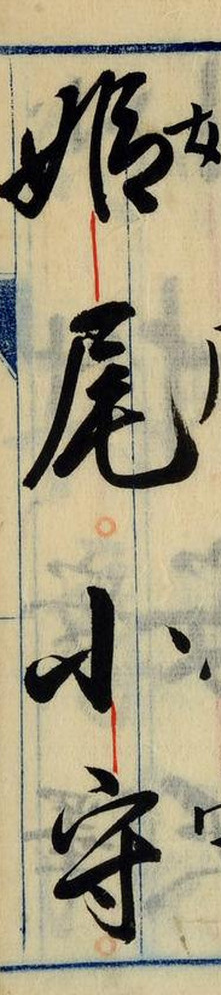姫尾小守

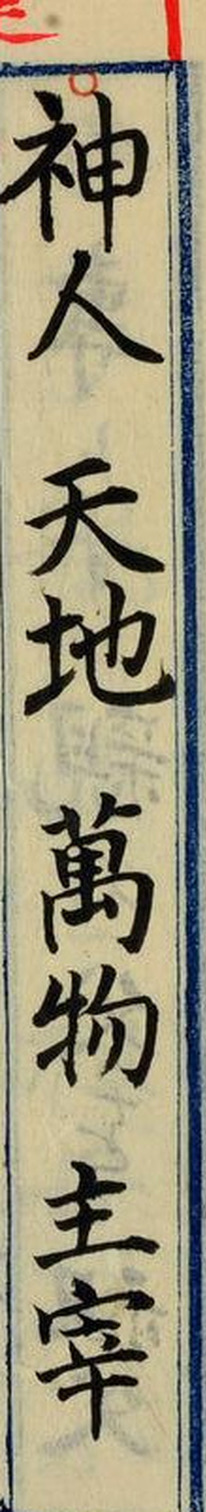神人天地萬物主宰
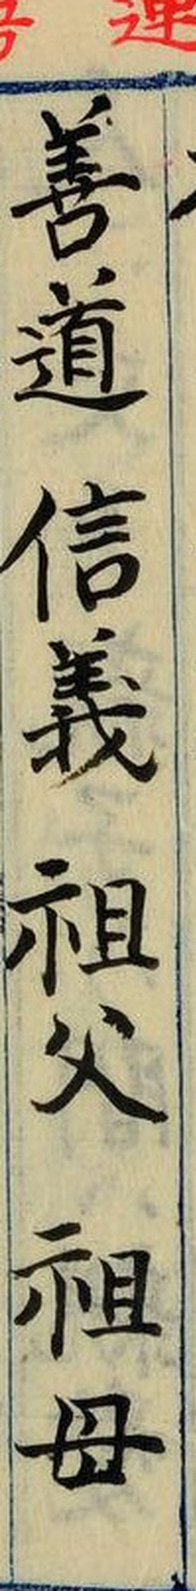善道信義祖父祖母
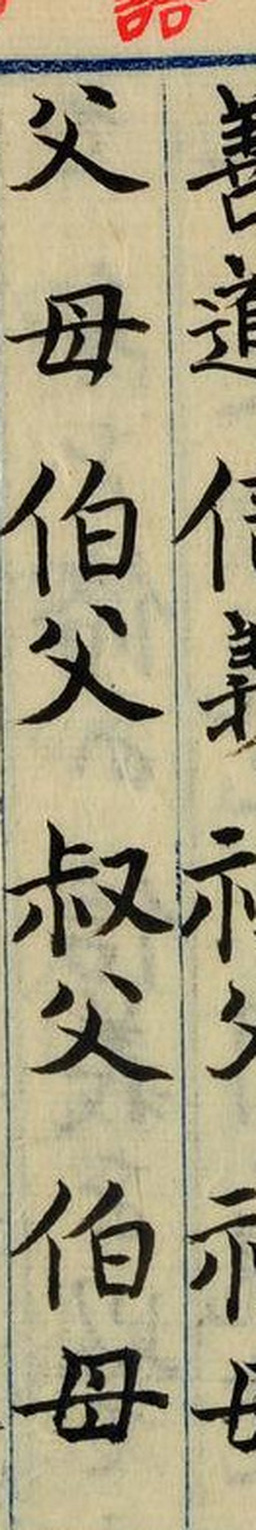父母伯父叔父伯母
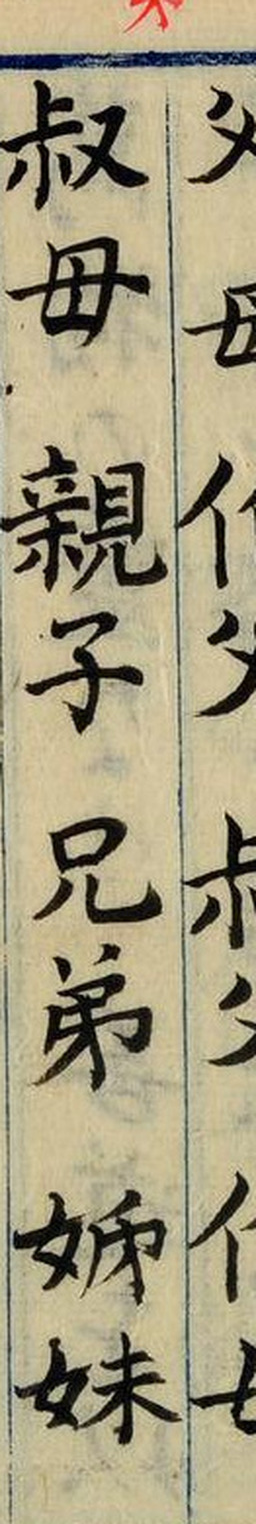叔母親子兄弟姉妹
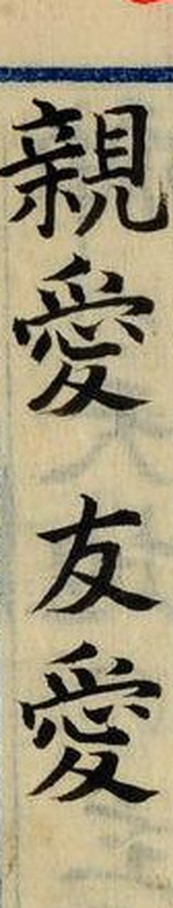親愛友愛

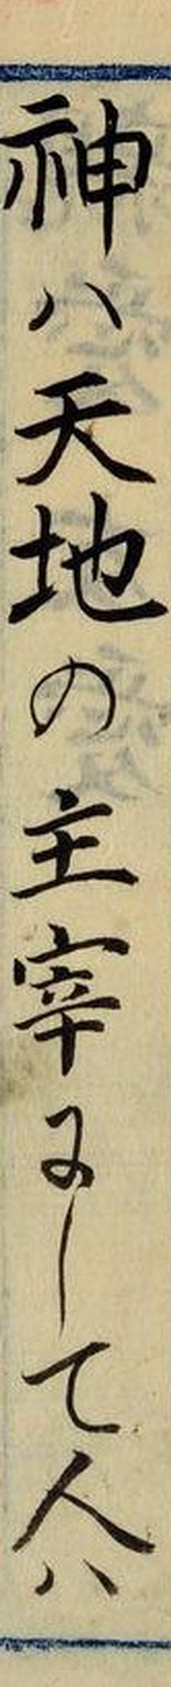神ハ天地の主宰にして人ハ
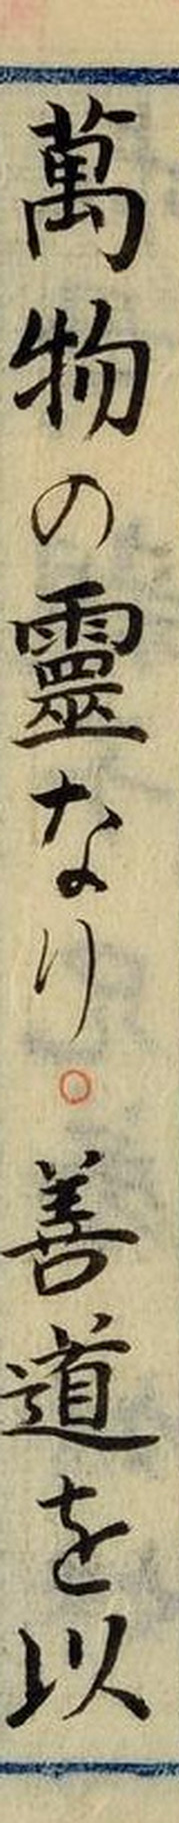萬物の霊なり〇善道を以
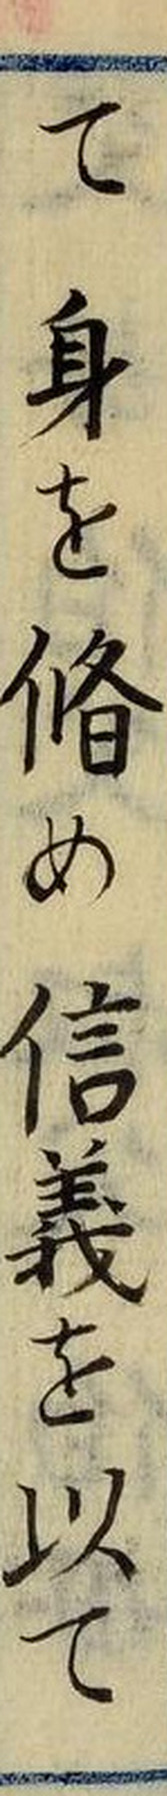て身を修め信義を以て
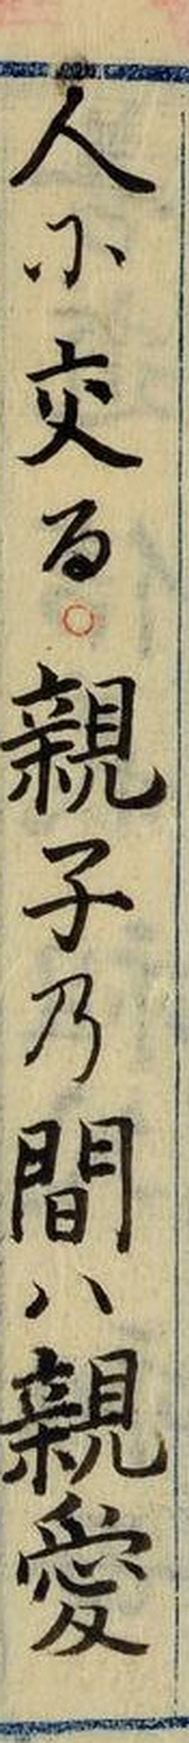人に交る〇親子乃間ハ親愛
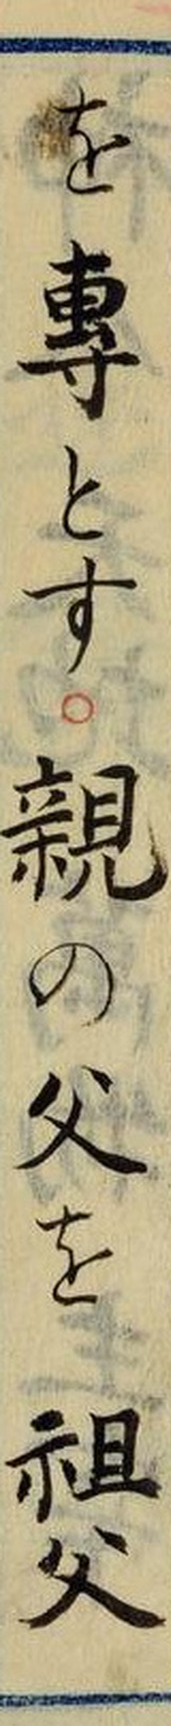を専とす〇親の父を祖父
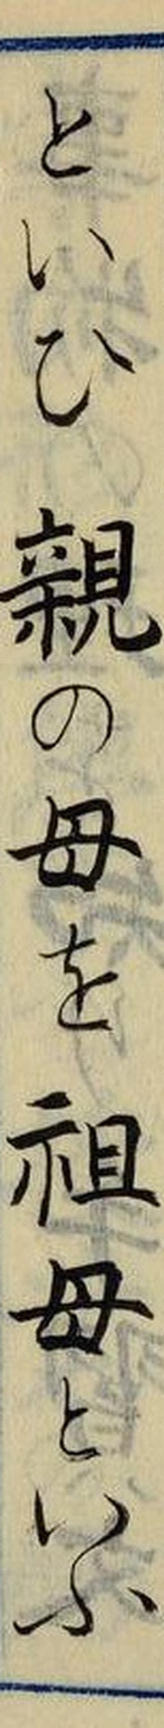といひ親の母を祖母といふ
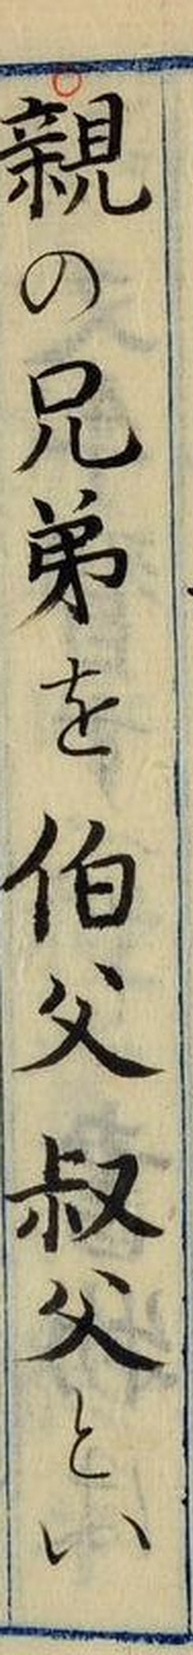〇親の兄弟を伯父叔父とい
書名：村名・連語
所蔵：福井県文書館 Fukui Prefectural Archives
